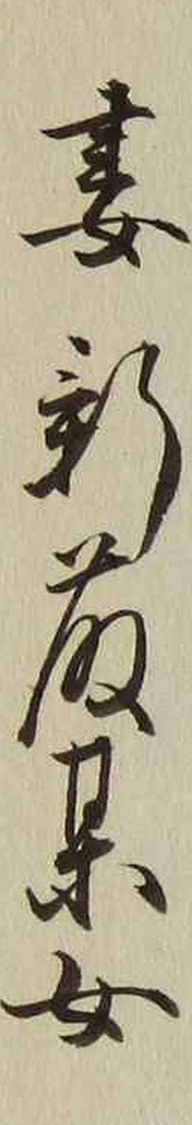妻新藤某女

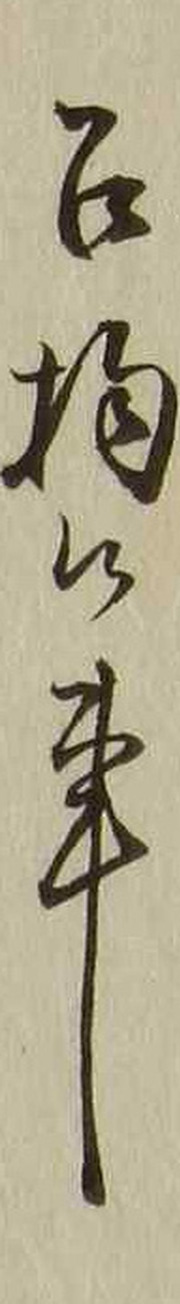召抱候事
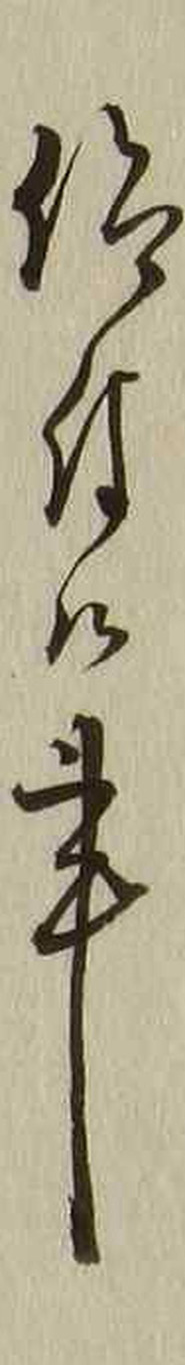仰付候事
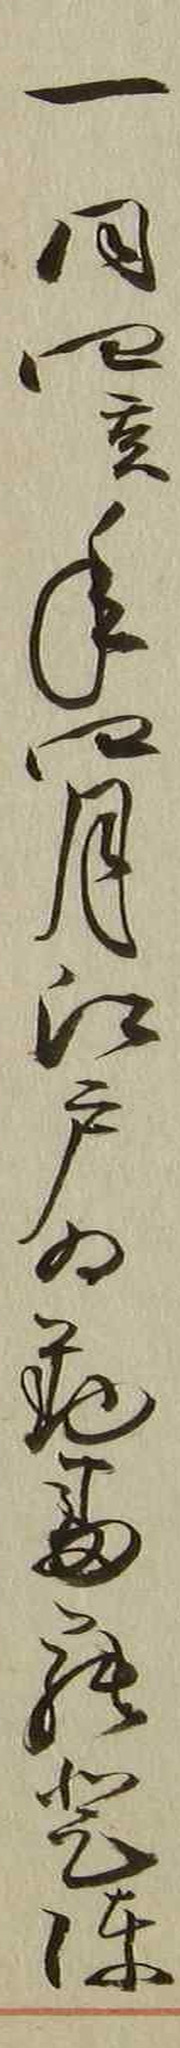一同四亥年四月江戸為勤番罷登陣
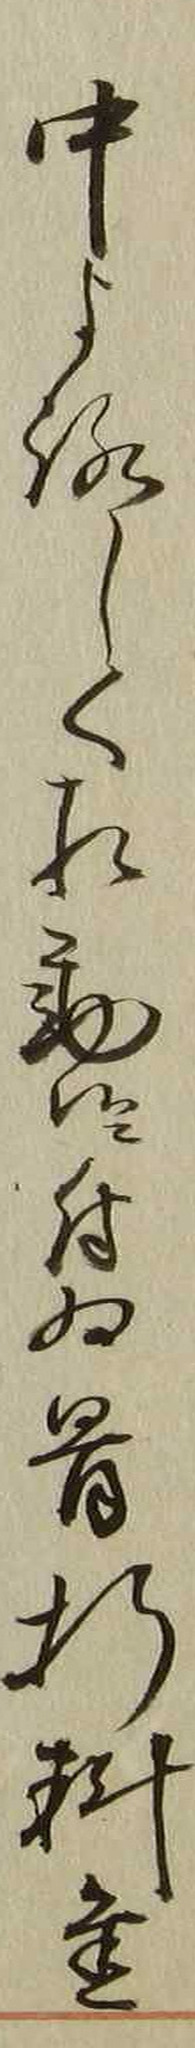中よろしく相勤候ニ付為骨折料金
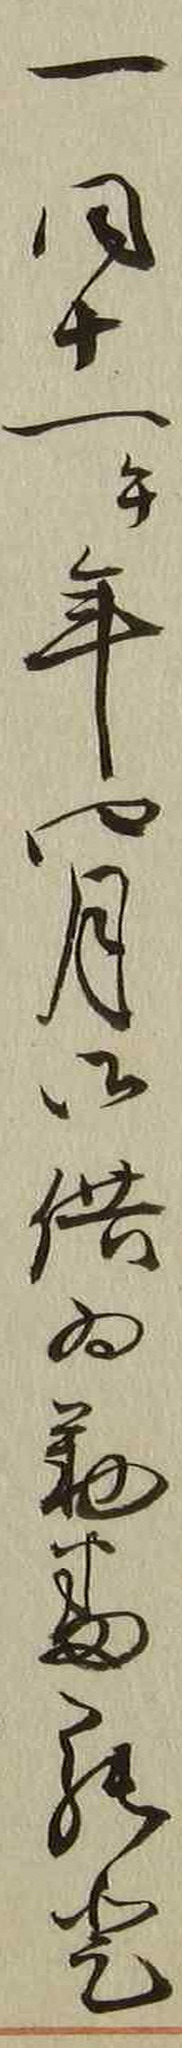一同十一午年四月御供為勤番罷登
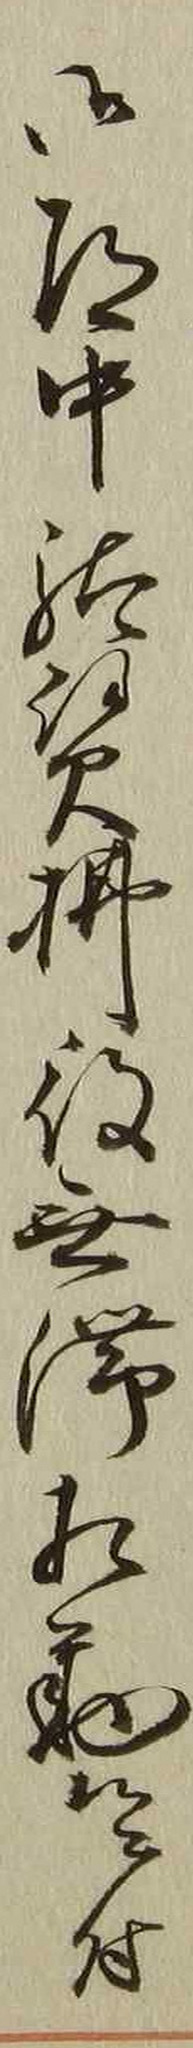御道中駄賃払役無滞相勤候ニ付
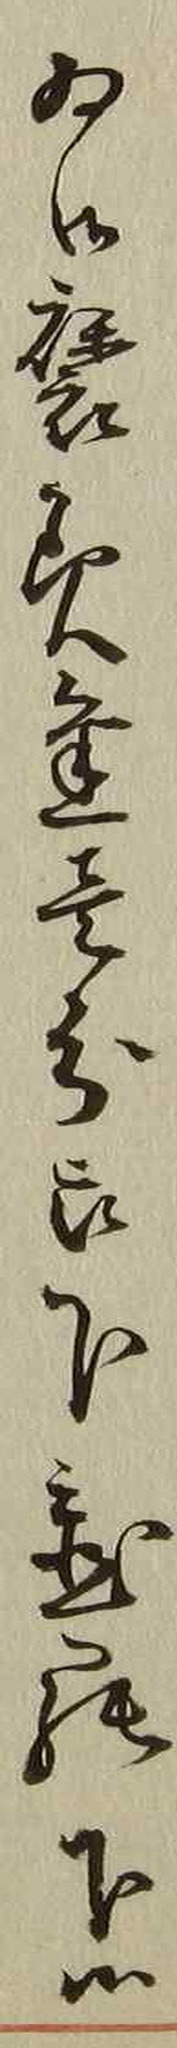為御褒美金壱分被下置罷下候
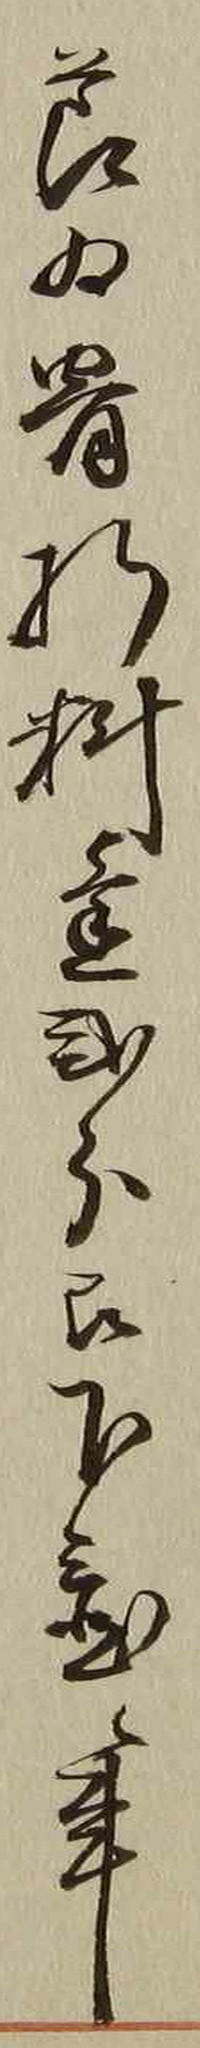節為骨折料金弐分被下置候事
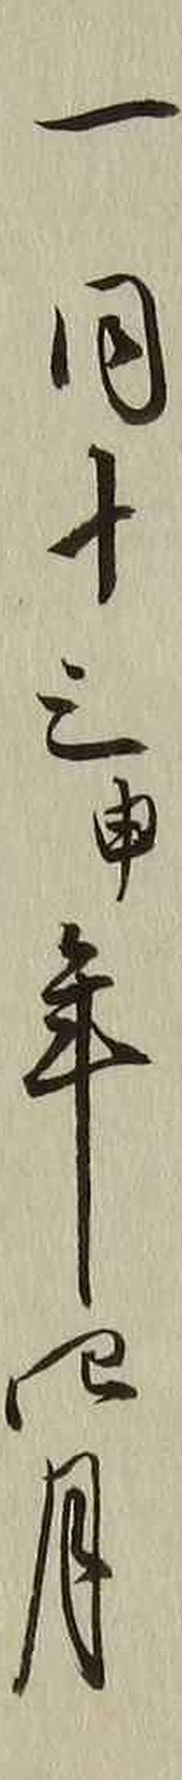一同十三申年四月
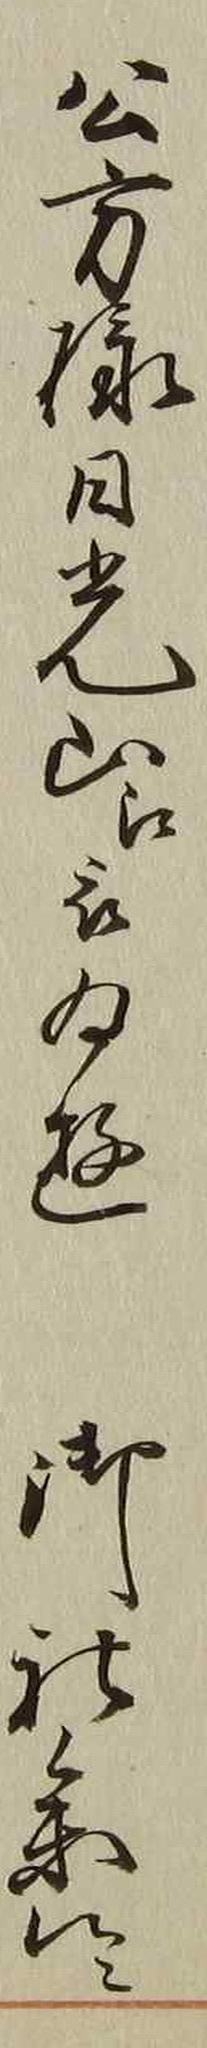公方様日光山江被為遊御社参候ニ
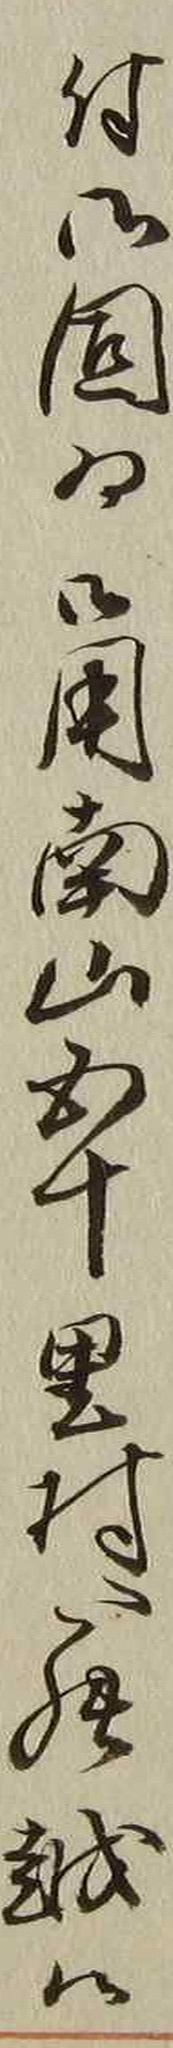付御固為御用南山五十里村へ罷越候
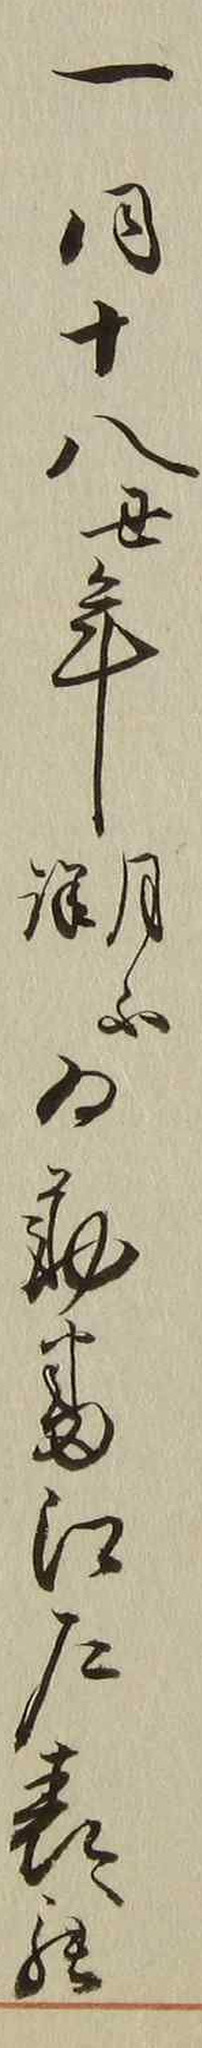一同十八丑年月不詳為勤番江戸表へ罷
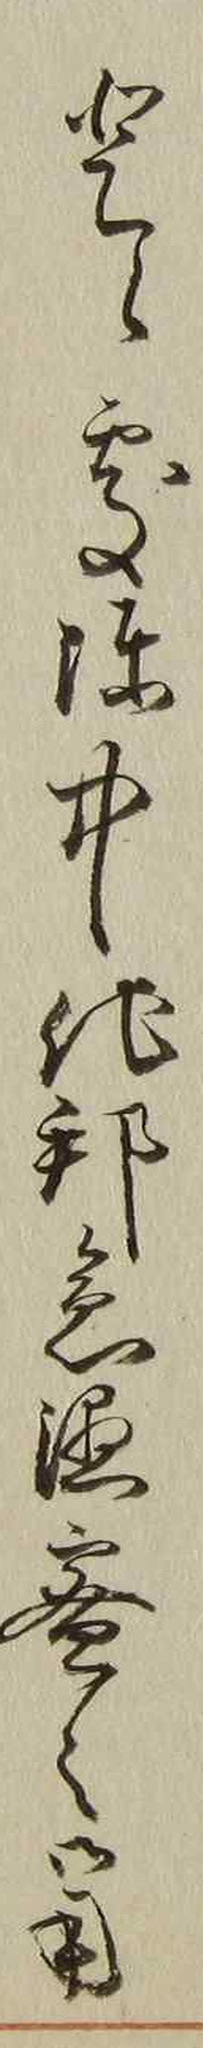登候処陣中他邦急湿密々御用
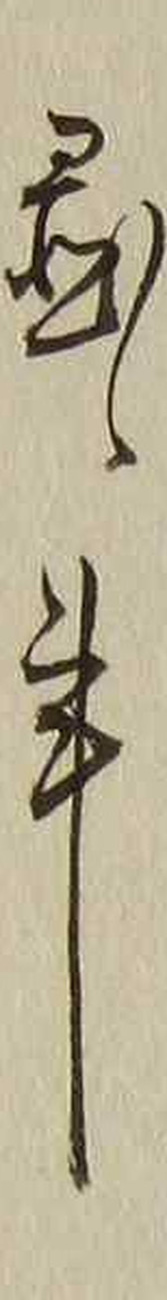置候事
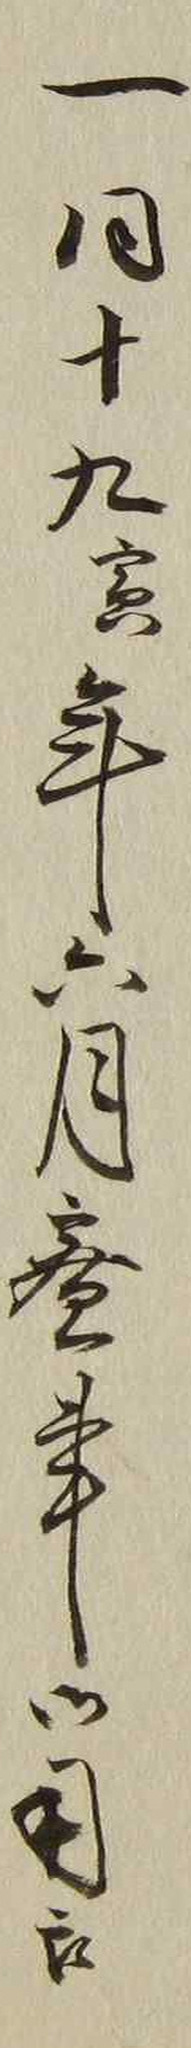一同十九寅年六月密事御用被
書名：諸士系譜　巻之57　ほ之部4
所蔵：会津若松市立会津図書館
